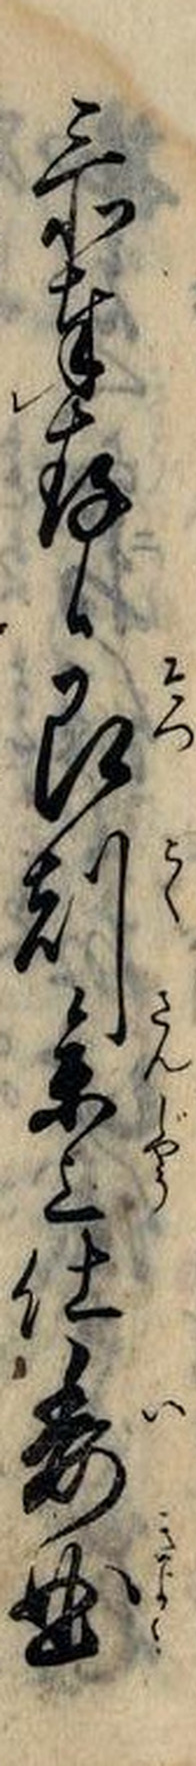忝奉存候即刻参上仕委曲
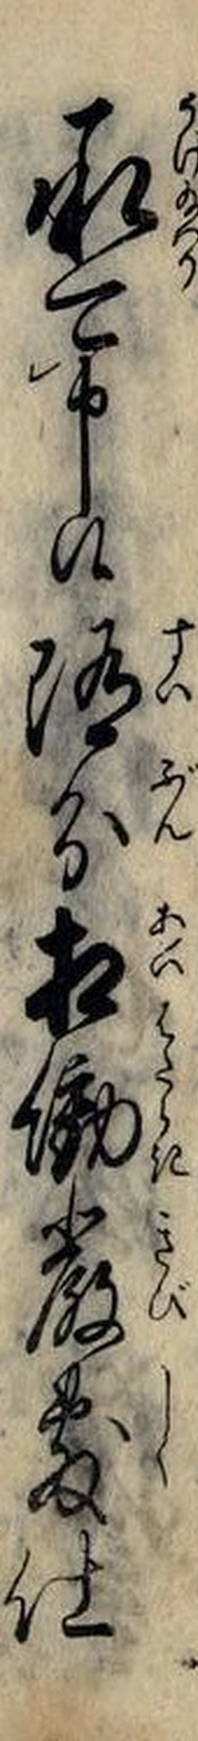承可申候随分相働厳敷仕
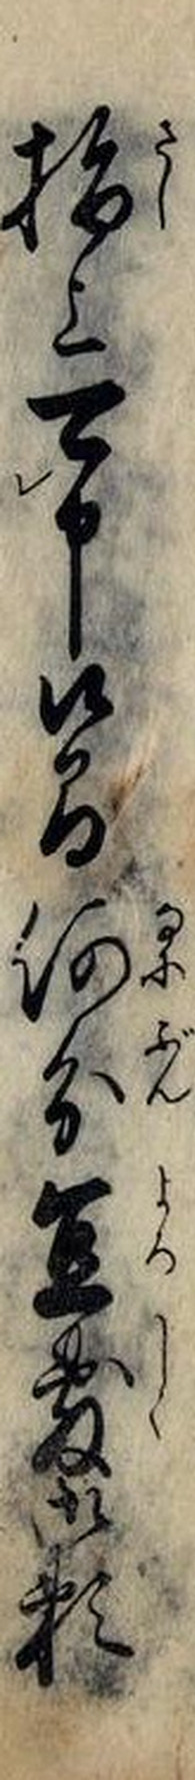指上可申候間何分宜敷御頼
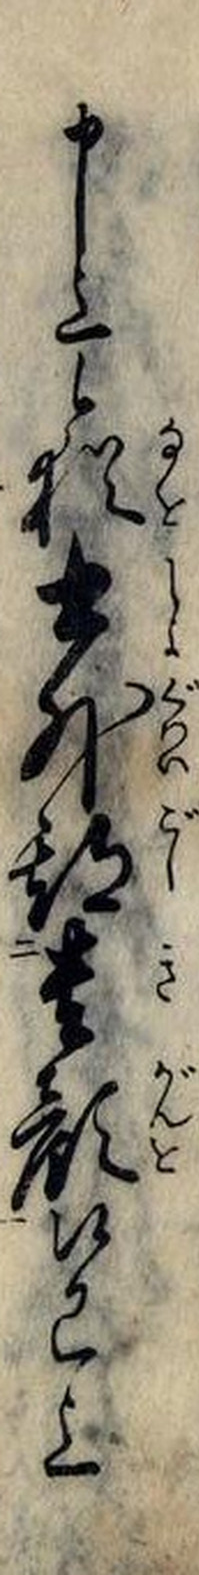申上候猶書外期貴顔候已上
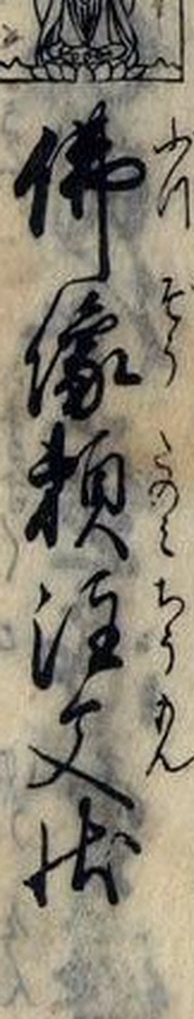佛像頼注文状

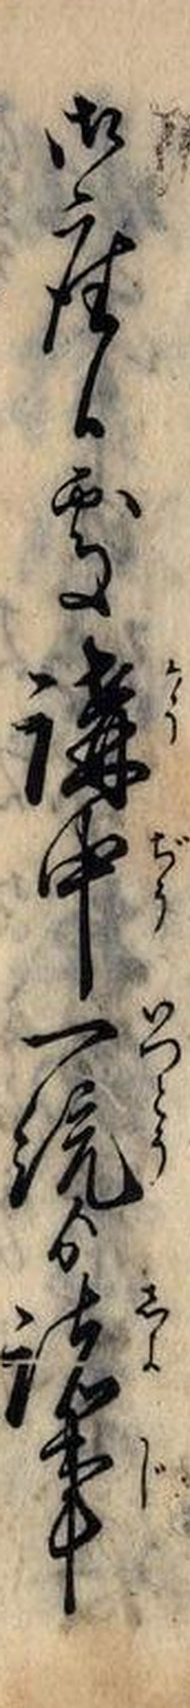御座候處講中一統ゟ諸事
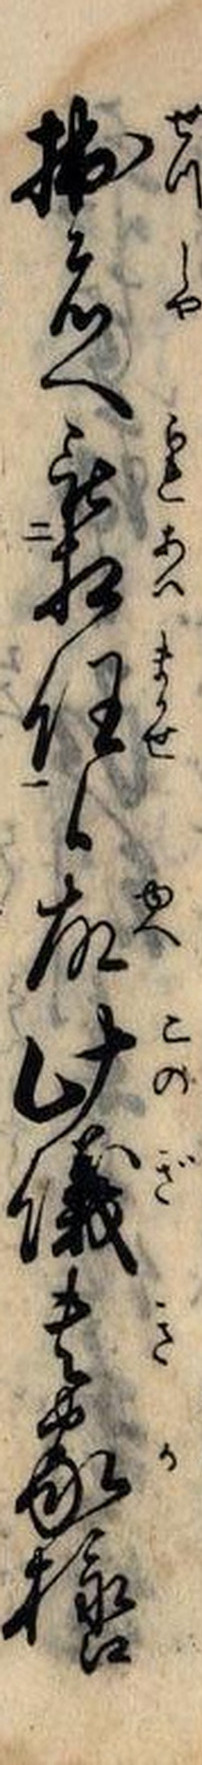拙者へ被相任候故此儀貴家様江
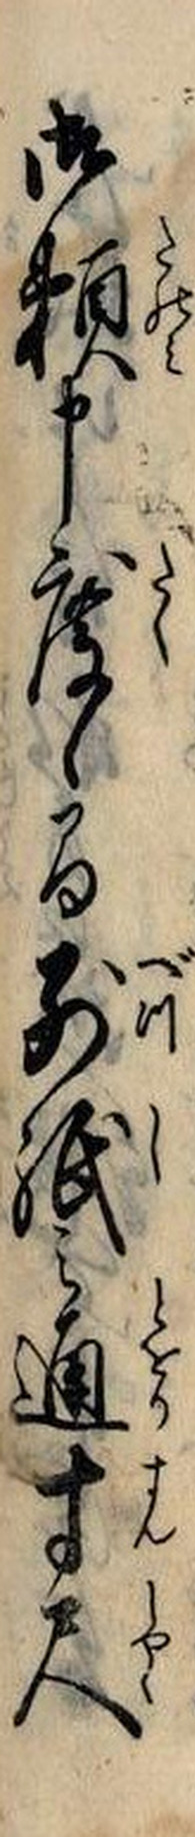御頼申度候間別紙之通寸尺
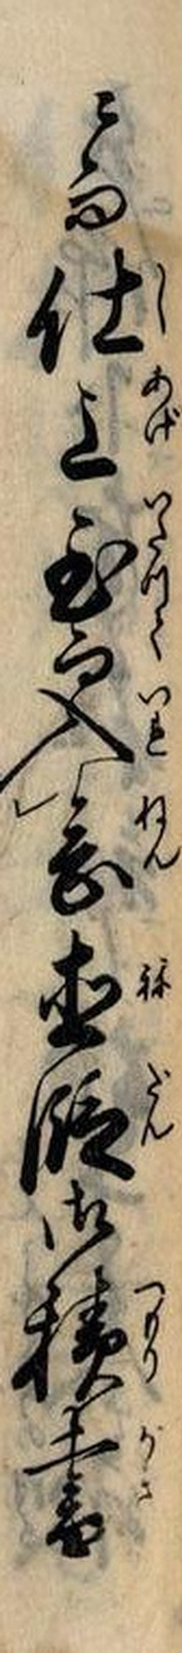に而仕上至而入念直段御積書
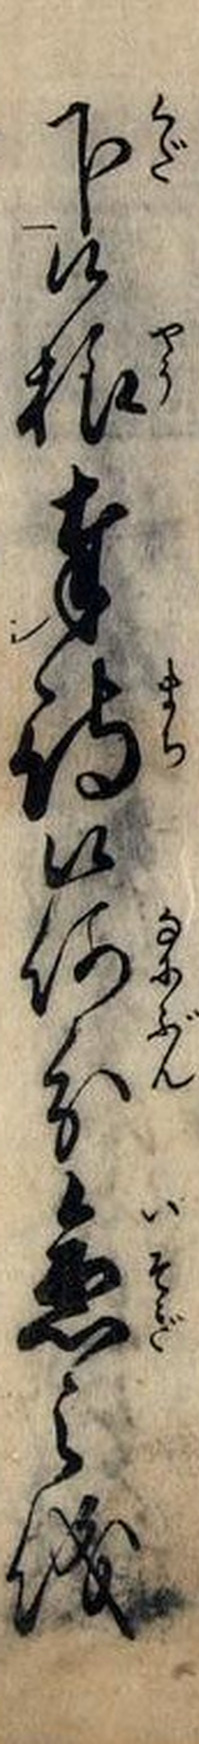下候様奉待候何分急之儀

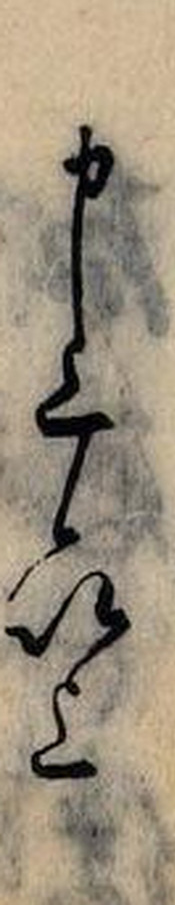申上候以上
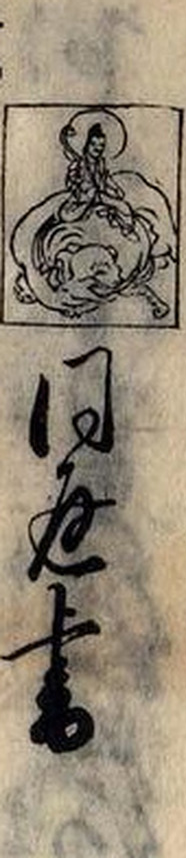同返書
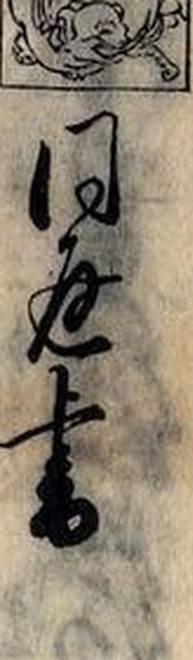同返書
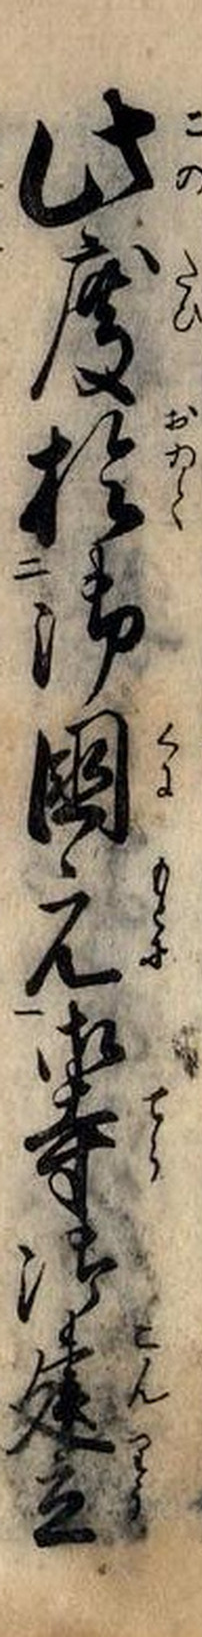此度於御國元御寺御建立
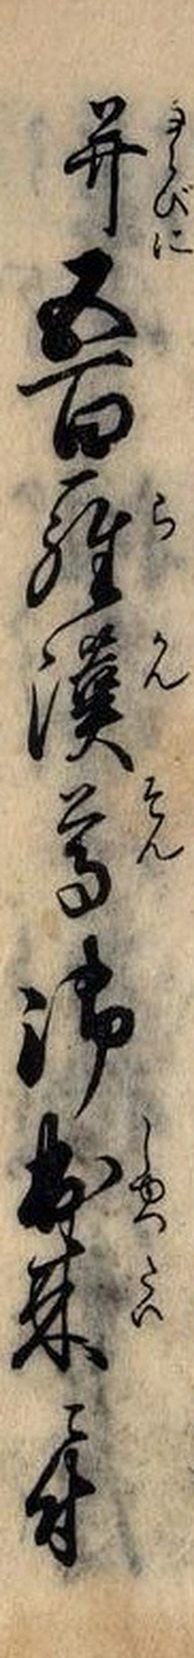并五百羅漢尊御出来に付
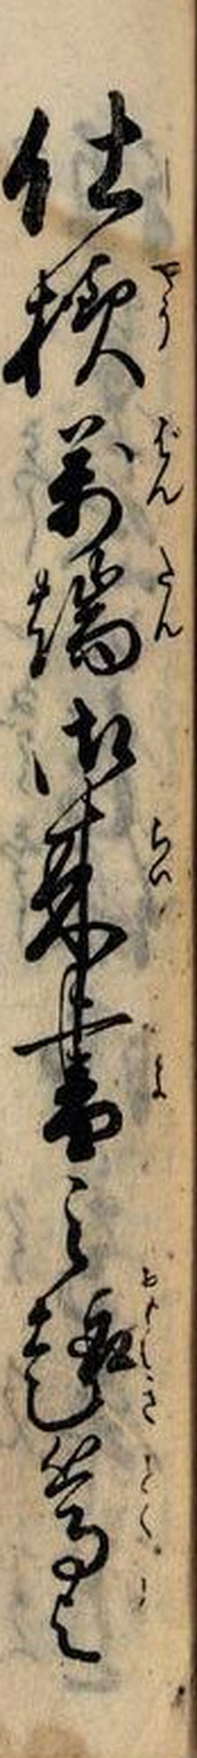仕様萬端御来書之趣篤与
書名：大成用文章（往来物）
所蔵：福井県文書館 Fukui Prefectural Archives
